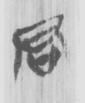君
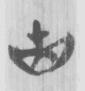鬯
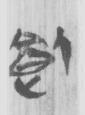飤
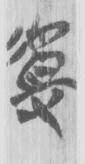{虍且又}
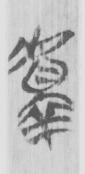鬳
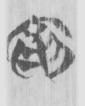龜
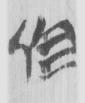於
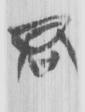君
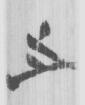之
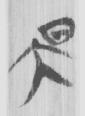{夨日}
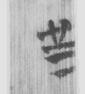{廿三}
